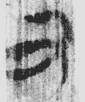又（有）
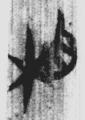相
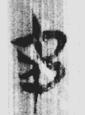串（患）
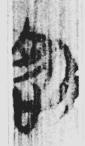割（害）
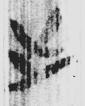之
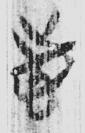志
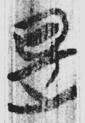是
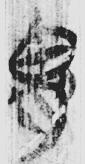胃（謂）
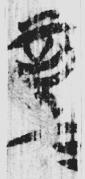童
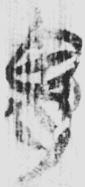胃（謂）
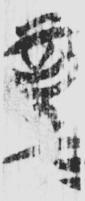童
